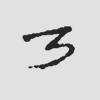乃
